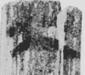大
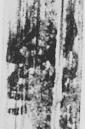○（夏）
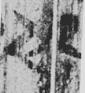女（如）
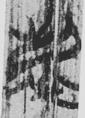○（表）
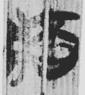𨟻（將）
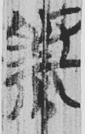祭
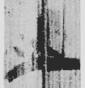之
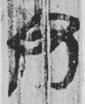尹
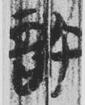許
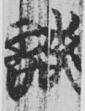諾
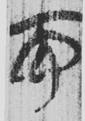而
